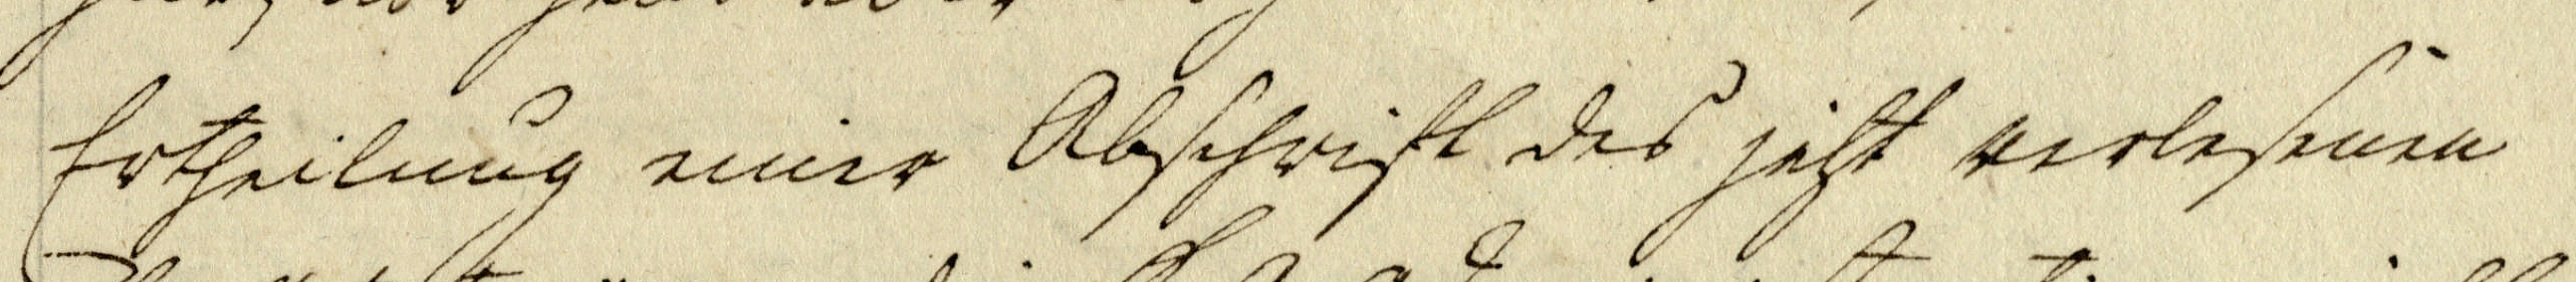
Ertheilung einer Abschrift des jetzt verlesenen
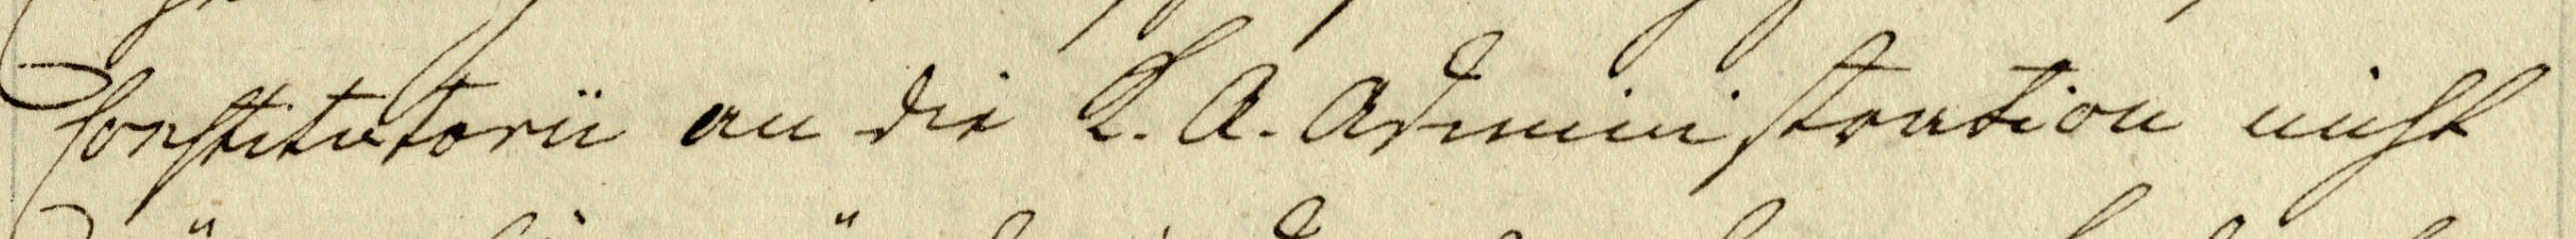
Contitutorii an die K. A. Administration nicht
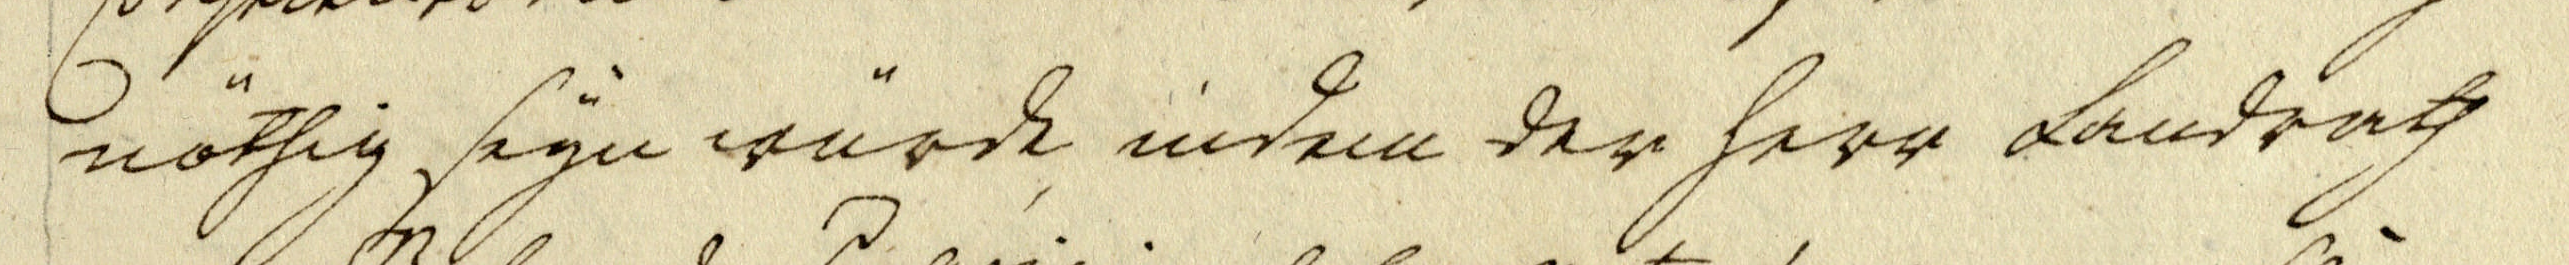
nöthig seÿn würde, indem der Herr Landrath
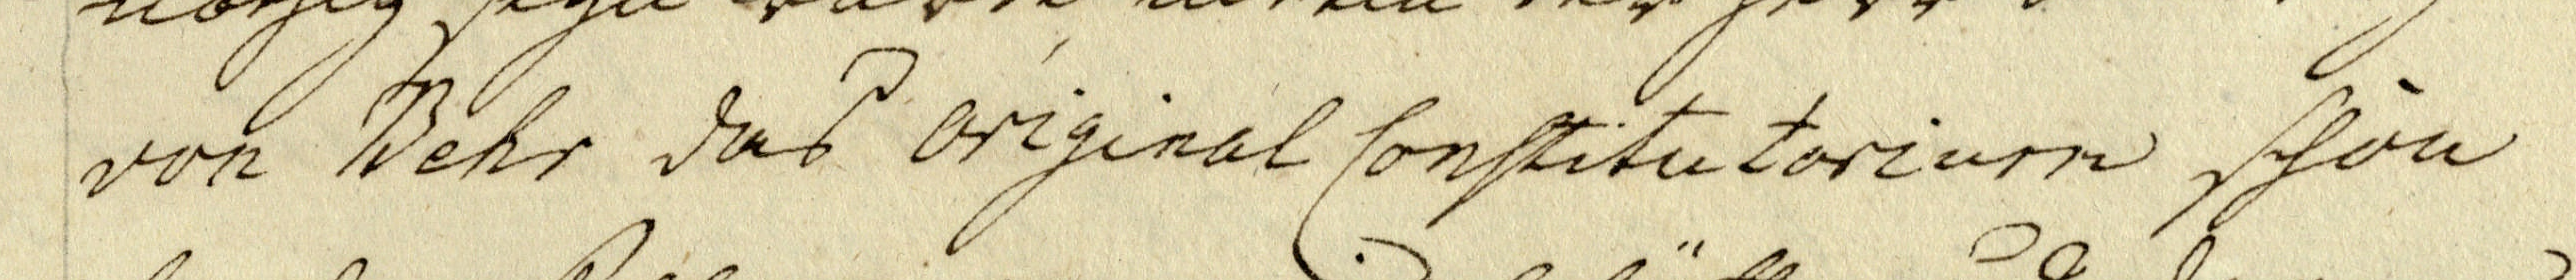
von Behr das Original Constitutorium schon
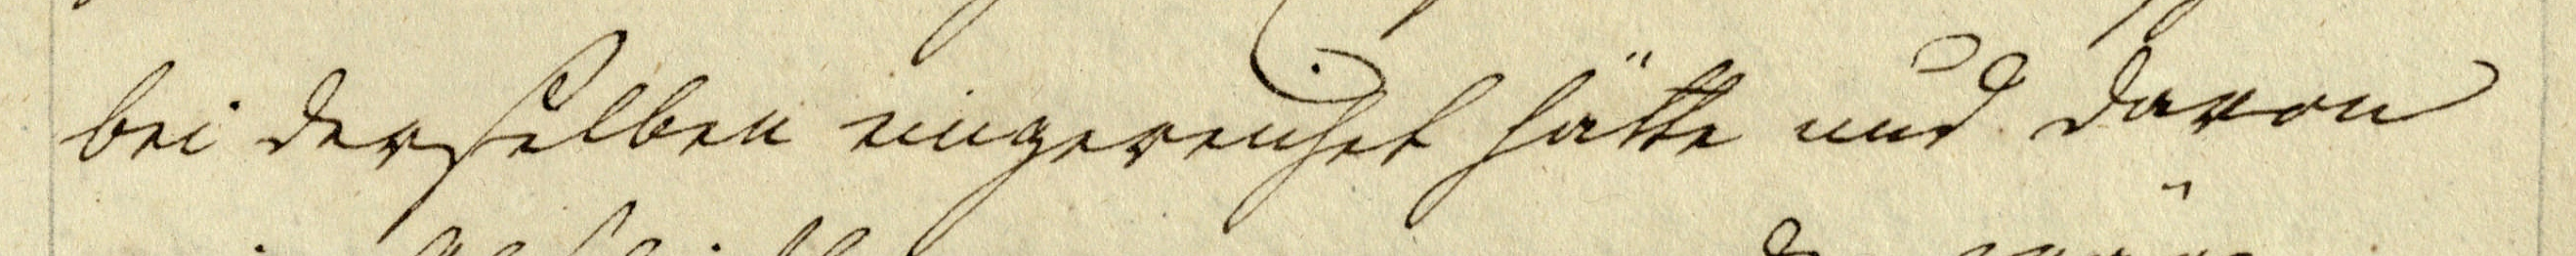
bei derselben eingereichet hätte und davon
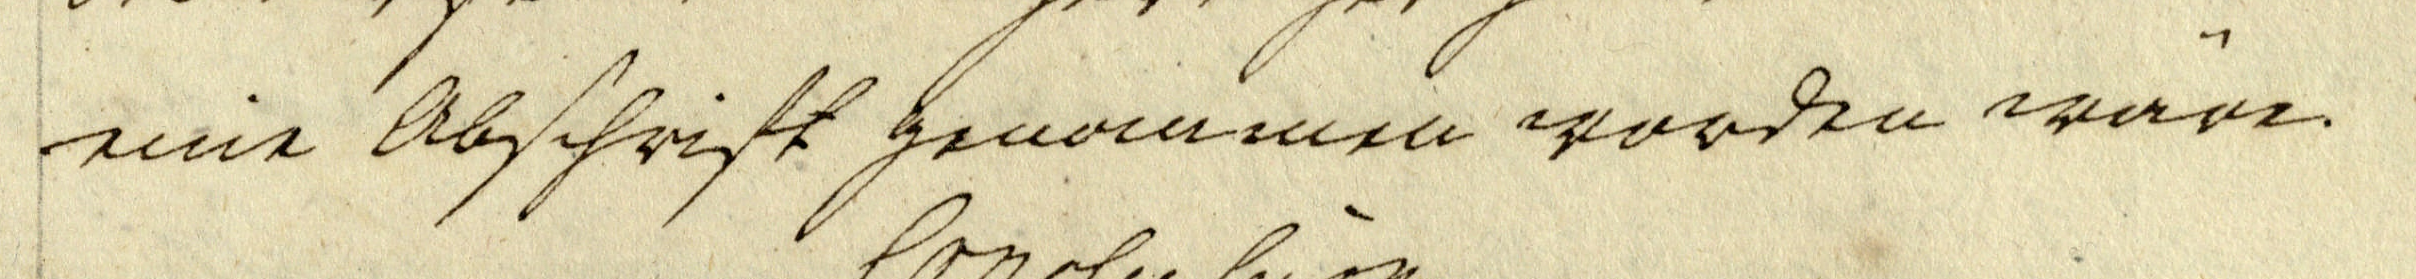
eine Abschrift genommen worden wäre.
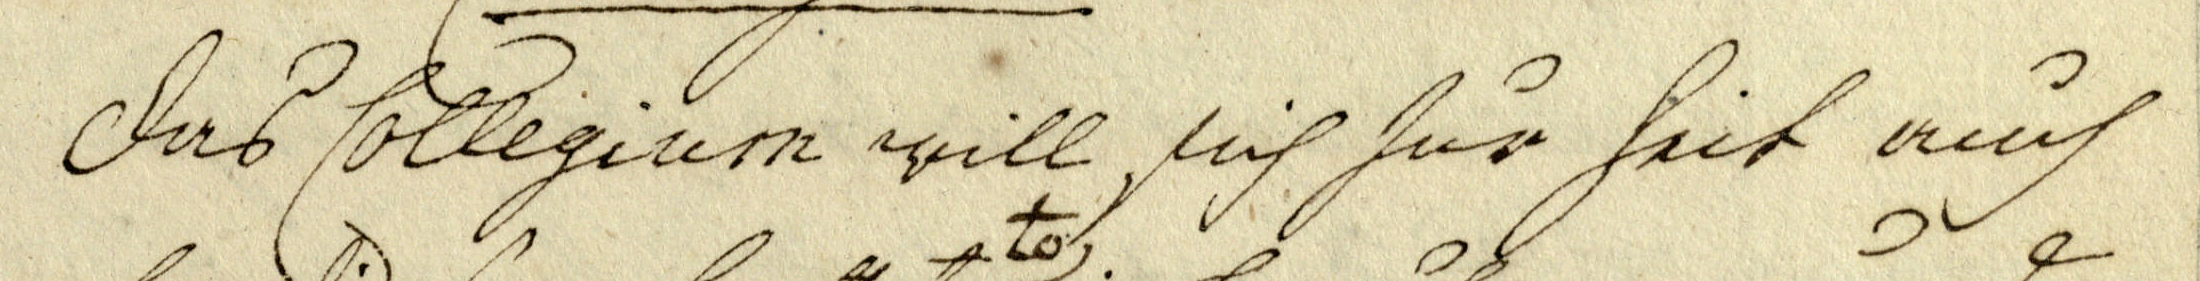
Das Collegium will sich zur Zeit auch
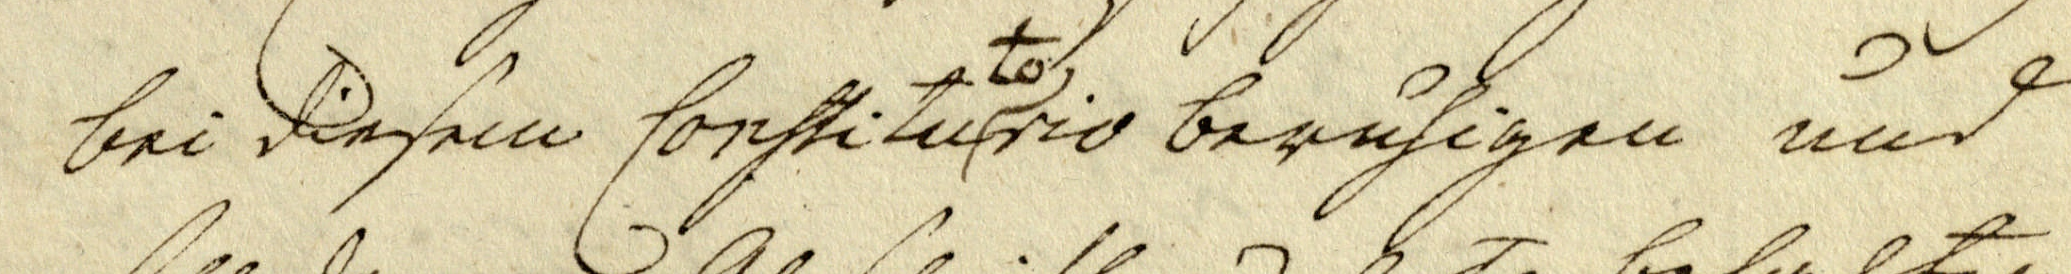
bei diesem Constitutorio beruhigen und
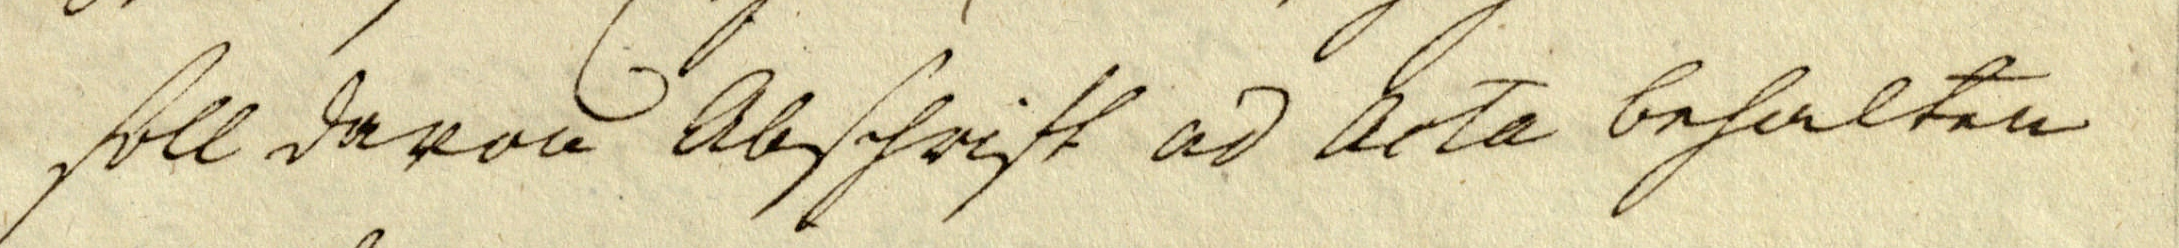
soll davon Abschrift ad Acta behalten
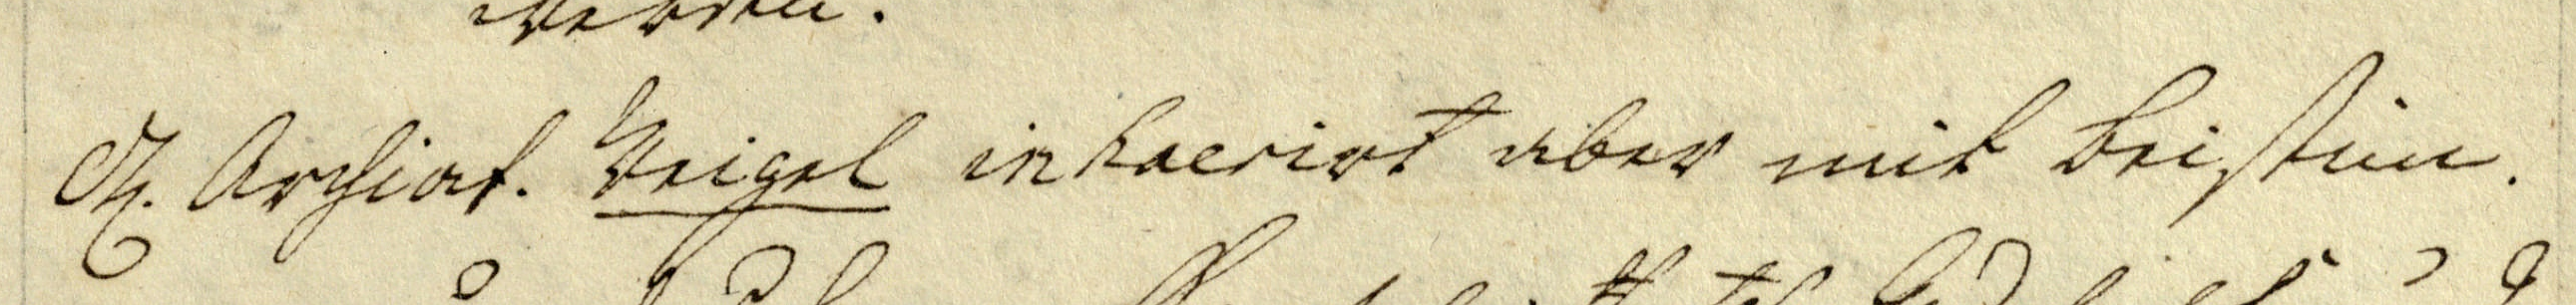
dh. Archiat. Weigel inhaerirt aber mit Beistim¬
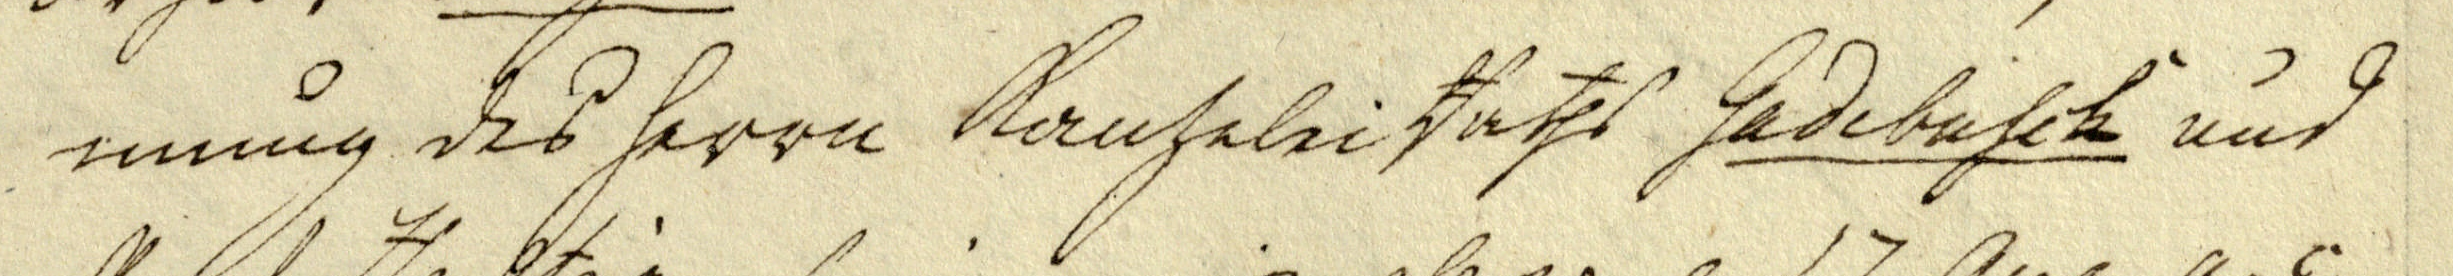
mung des Herrn Kanzelei Raths Gadebusch und
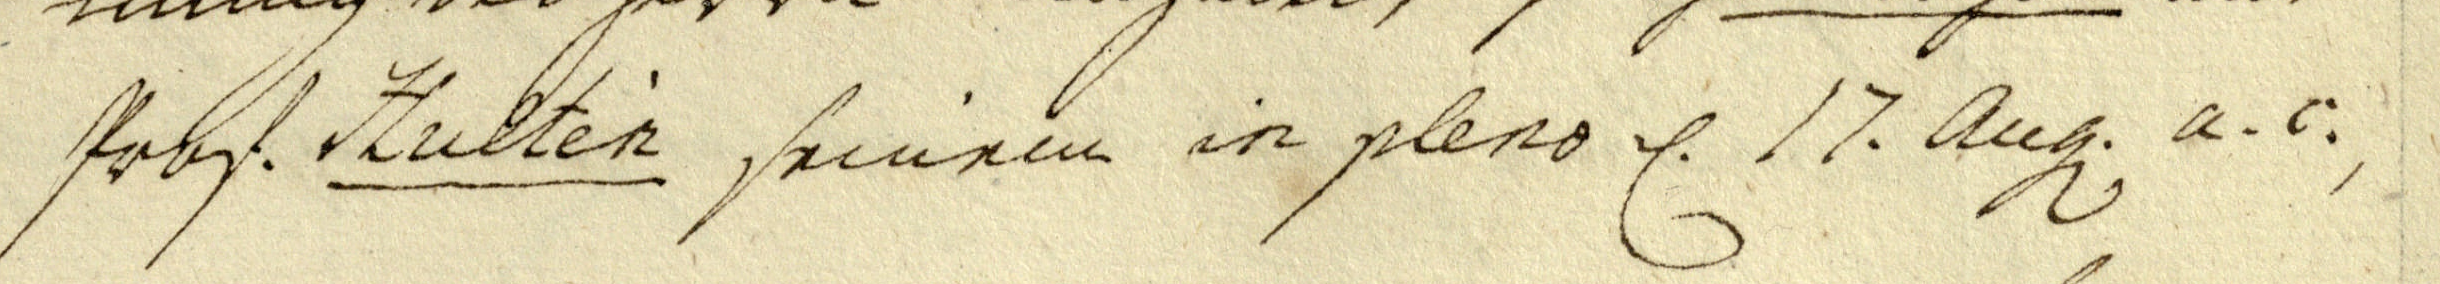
Prof. Hultén seinem in pleno d. 17. Aug., a. c.
